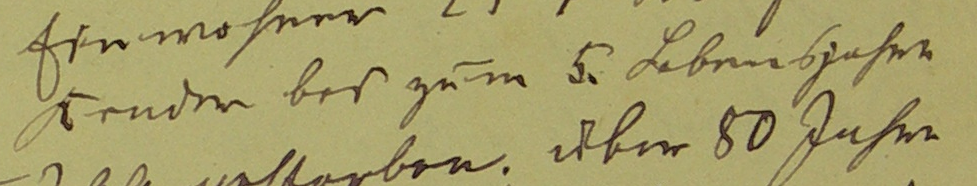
Kinder bis zum 5. Lebensjahr
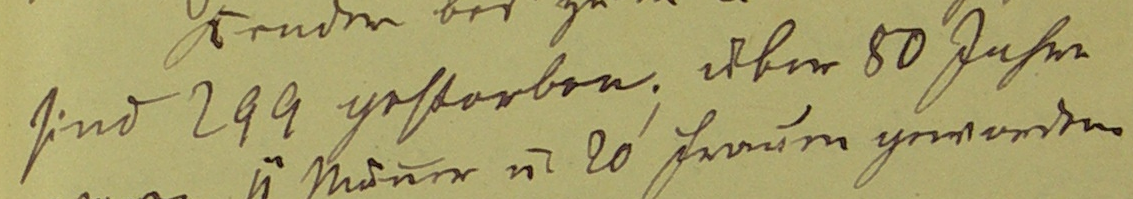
sind 299 gestorben; über 80 Jahre
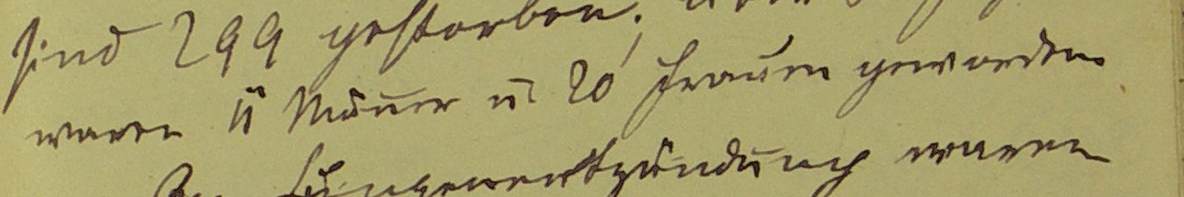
waren 11 Männer und 20 Frauen geworden .
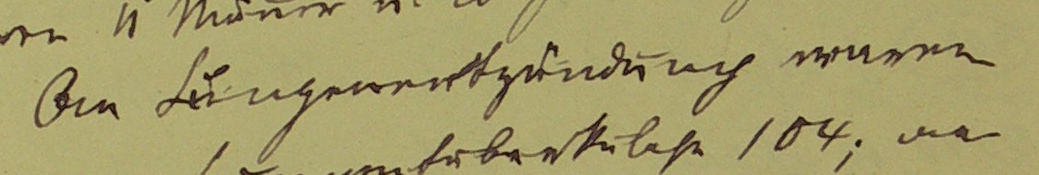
An Lungenentzündung waren
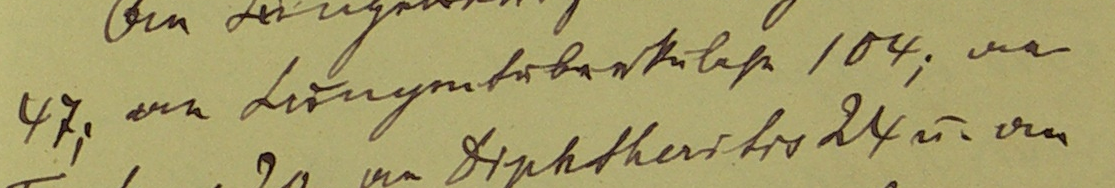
47; an Lungentuberkulose 104; an
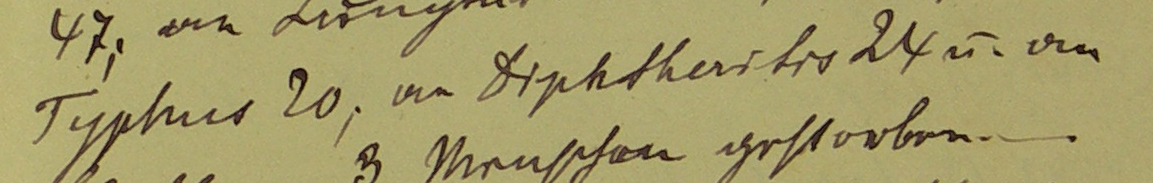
Typhus 20; Dyphteritis 24 und an
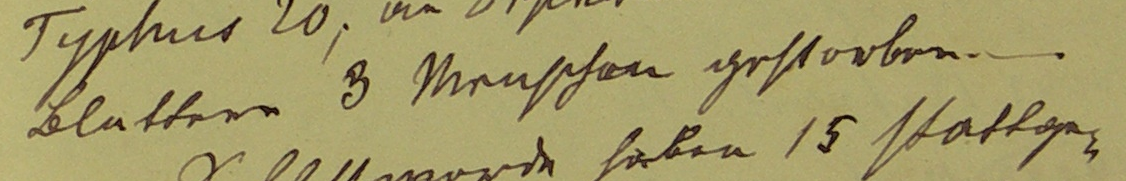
Blattern 3 Menschen gestorben.
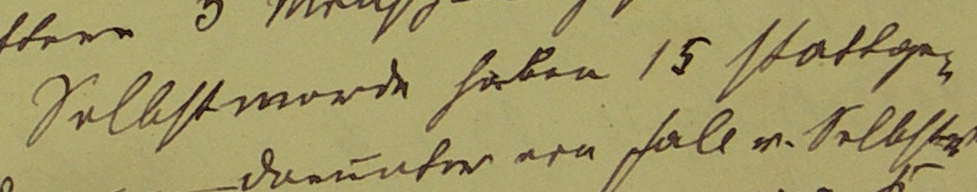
Selbstmorde haben 15 stattge¬
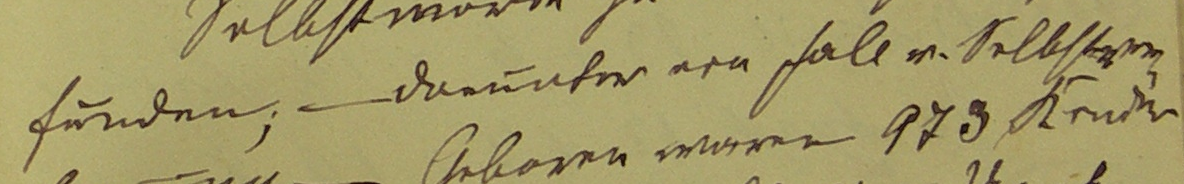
funden;- -Darunter ein Fall von Selbstver¬
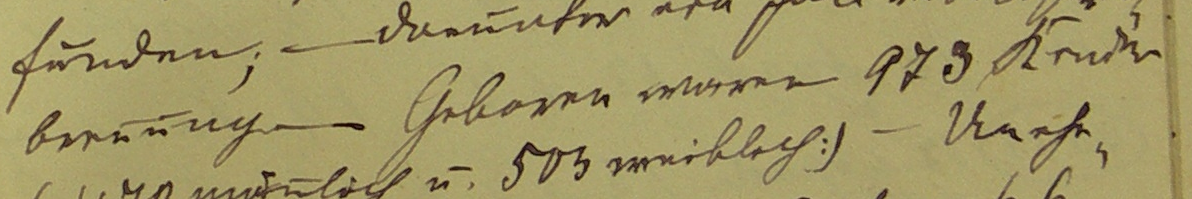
brennung. Geboren waren 973 Kinder
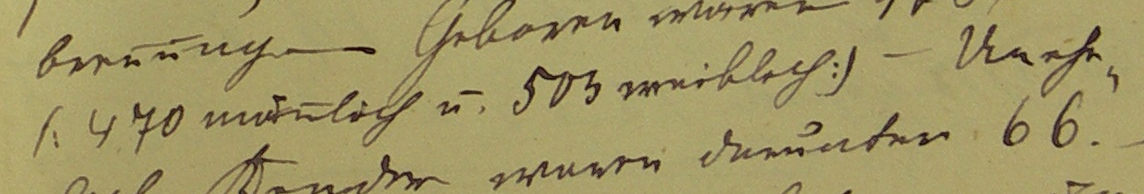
(: 470 männlich und 503 weiblich : ) - -Unehe¬
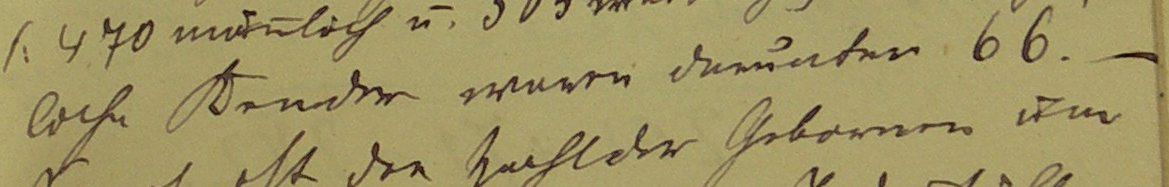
liche Kinder waren darunter 66.-
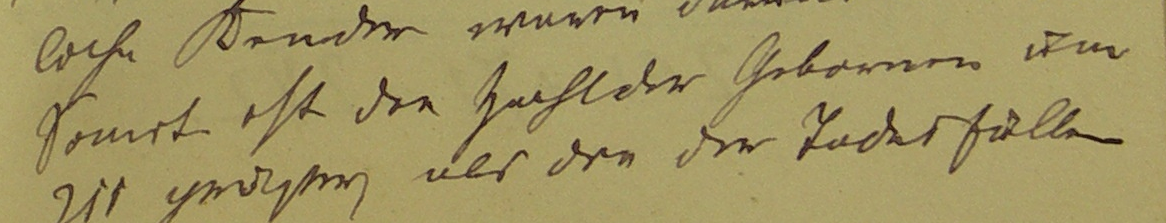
Somit ist die Zahl der geborenen um
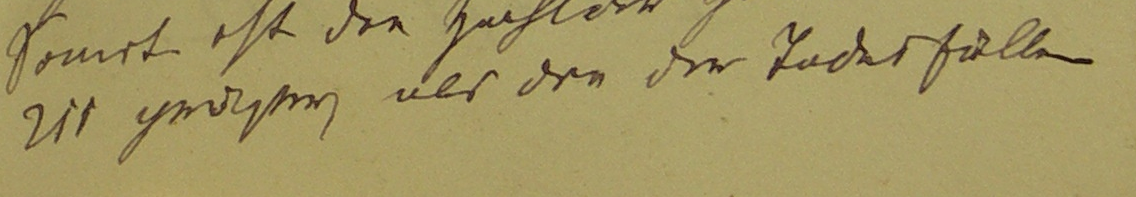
211 größer als die der Todesfälle
